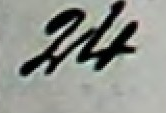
24
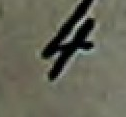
4
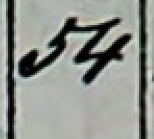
54
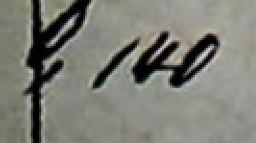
0,140
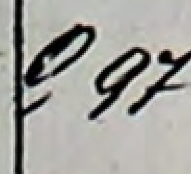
0,97
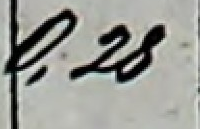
0,28
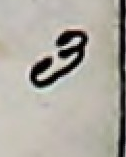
3
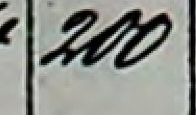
200
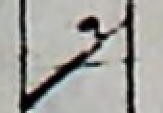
7
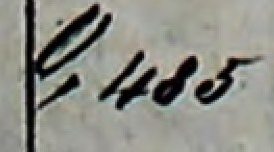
0,485
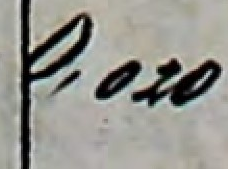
0,020
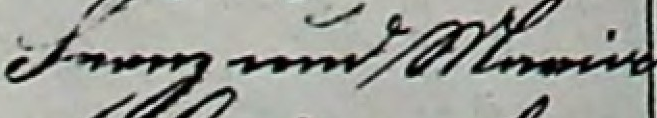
Franz und Maria
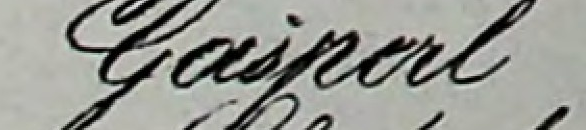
Gasperl
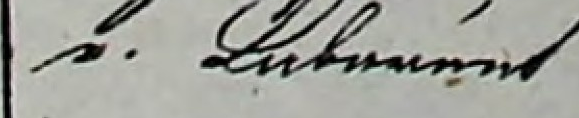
v. Labarent
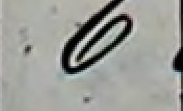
6
